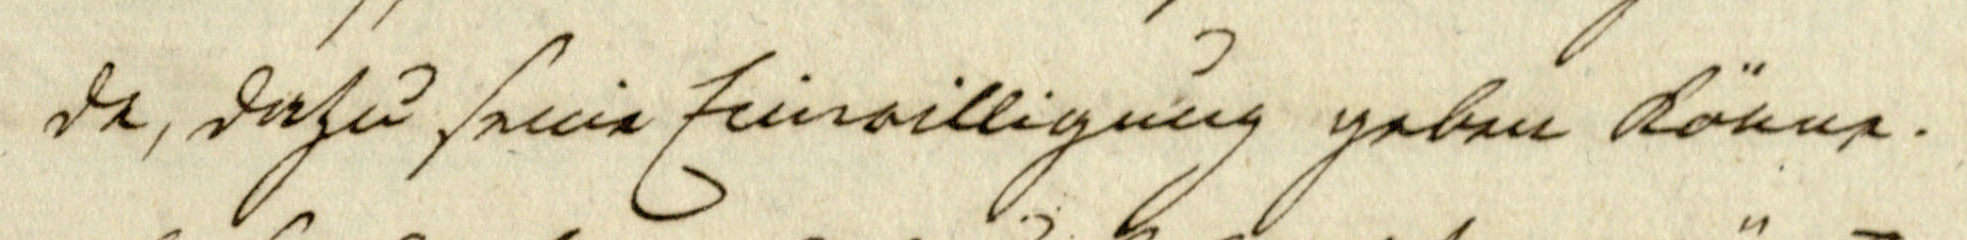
de, dazu seine Einwilligung geben könne.
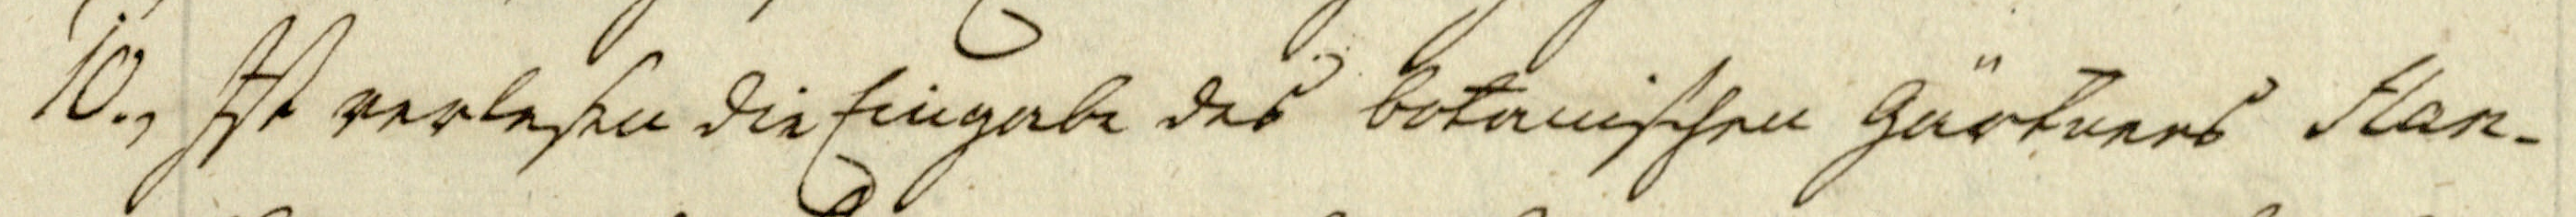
10., Ist verlesen die Eingabe des botanischen Gärtners Han¬
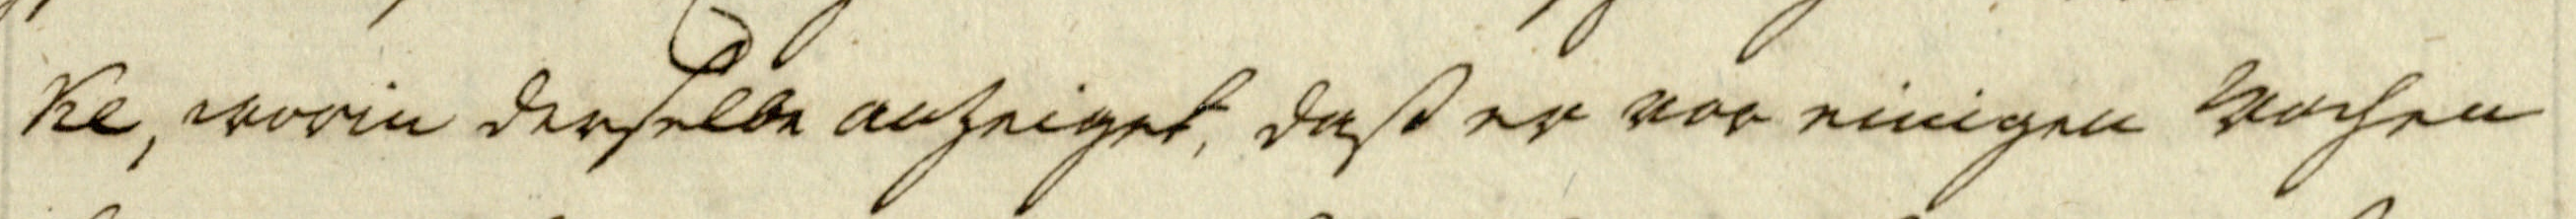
ke, worin derselbe anzeiget, daß er vor einigen Wochen
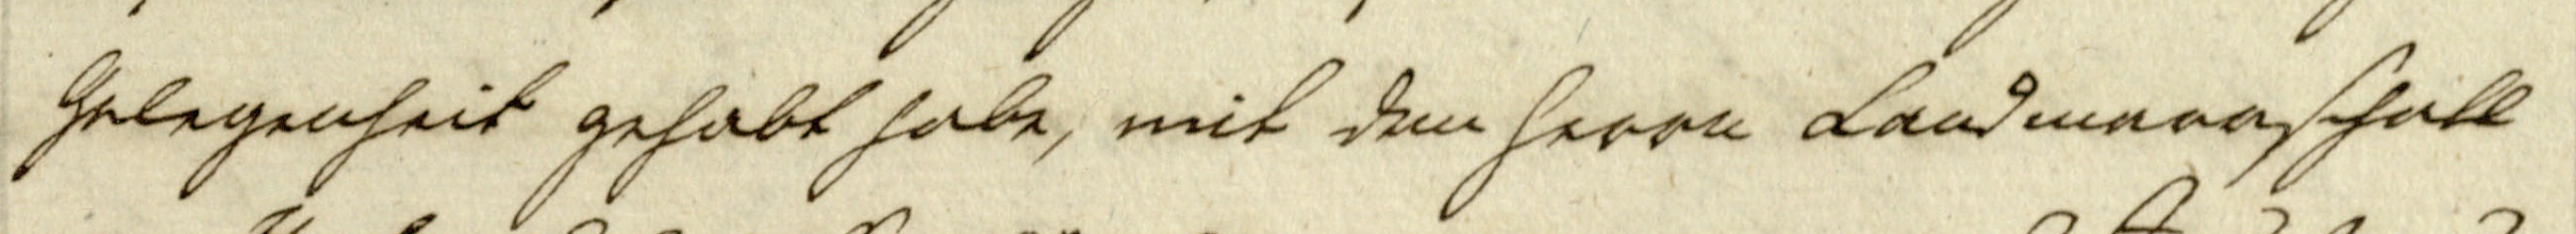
Gelegenheit gehabt habe, mit dem herrn Landmarrschall
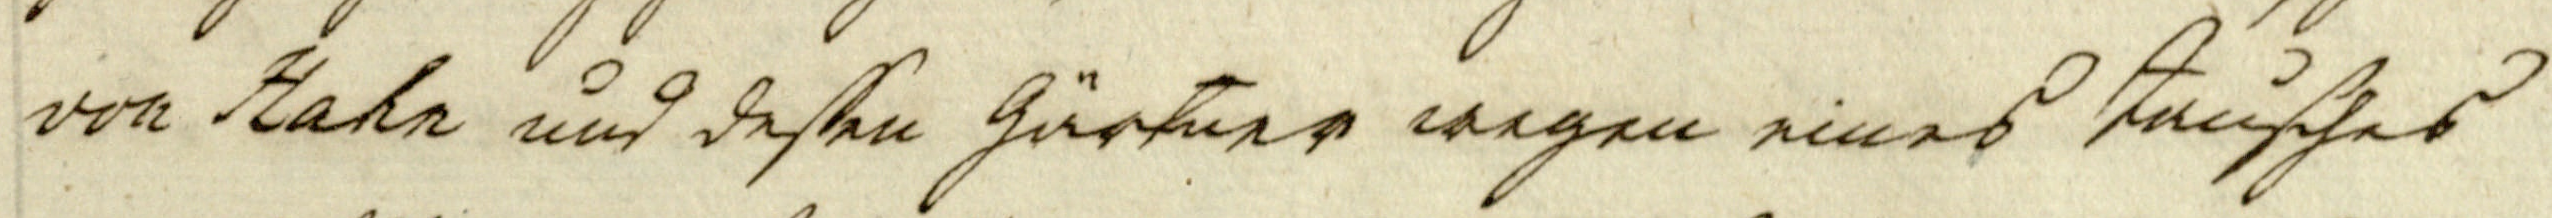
von Hahn und dessen Gärtner wegen eines Tausches
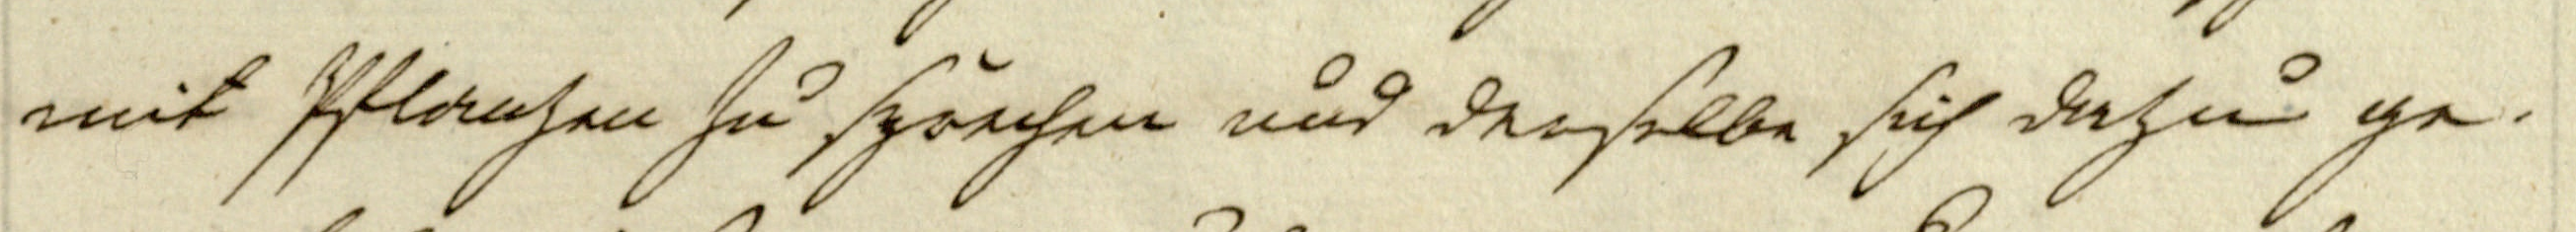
mit Pflanzen zu sprechen und derselbe sich dazu ge¬
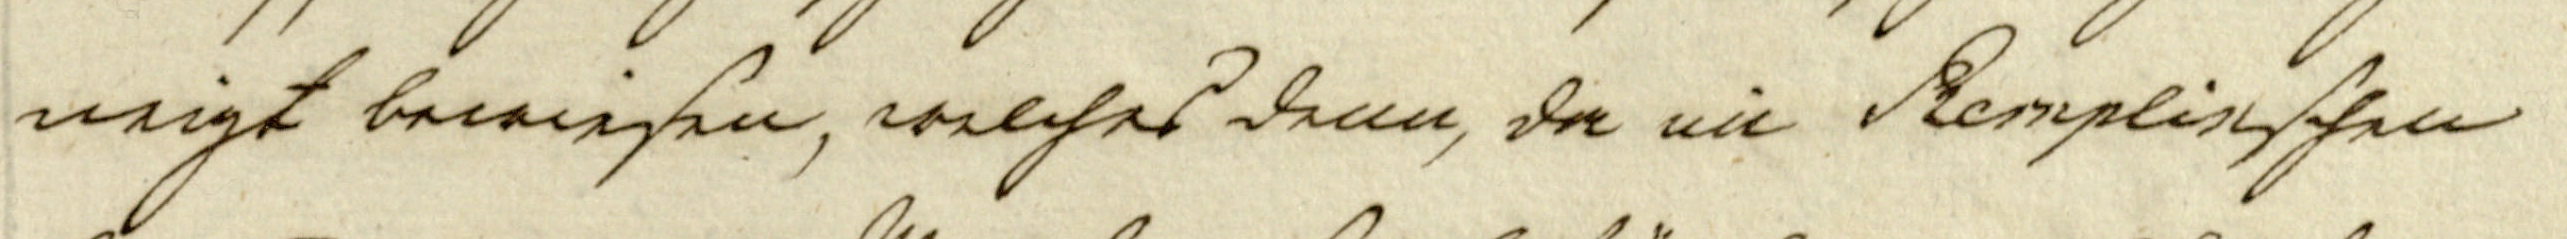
neigt bewiesen, welches denn, da im Remplinschen
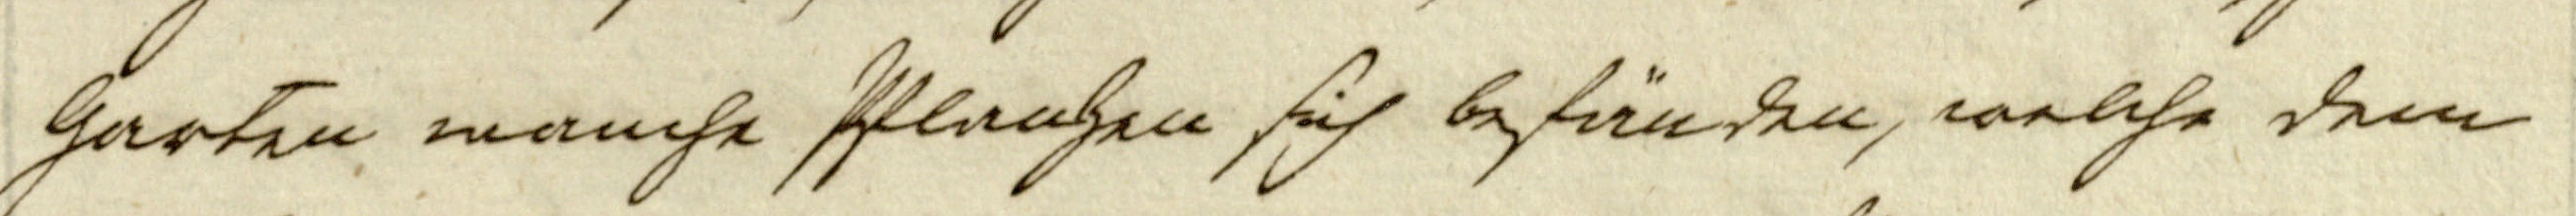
Garten manche Pflanzen sich befänden, welche dem
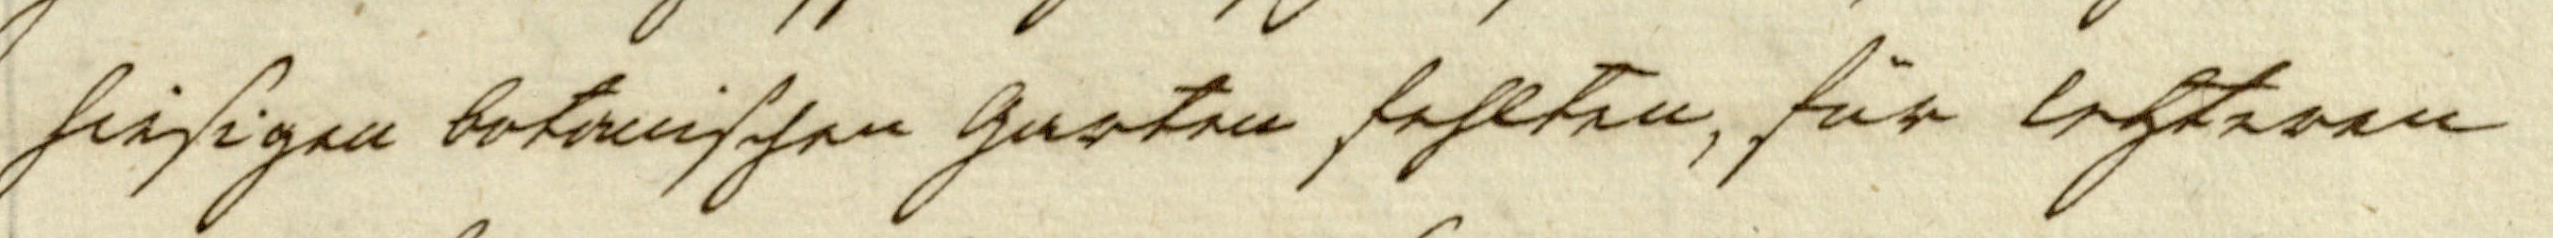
hiesigen botanischen Garten fehlten, für letzteren
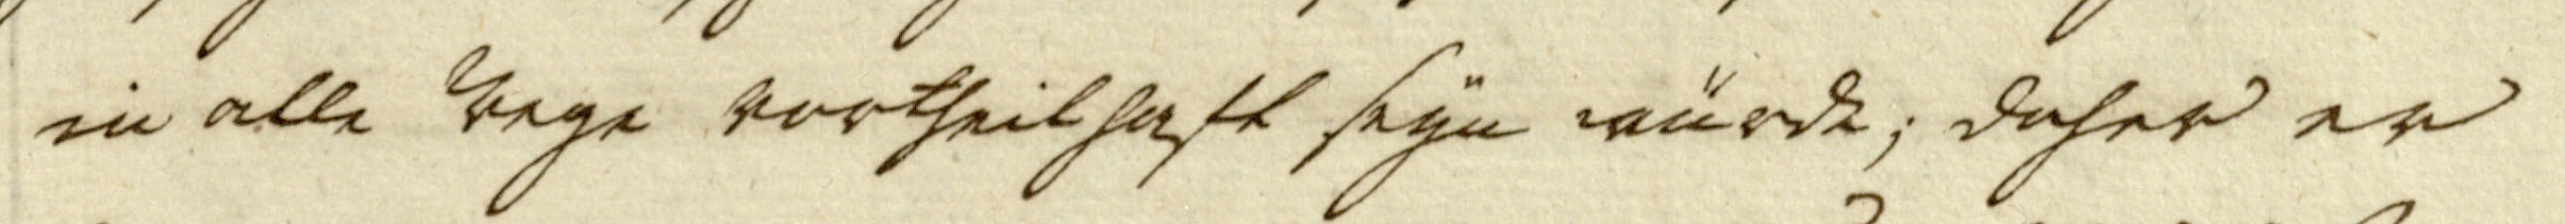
in alle Wege vortheilhaft seÿn würde; daher er
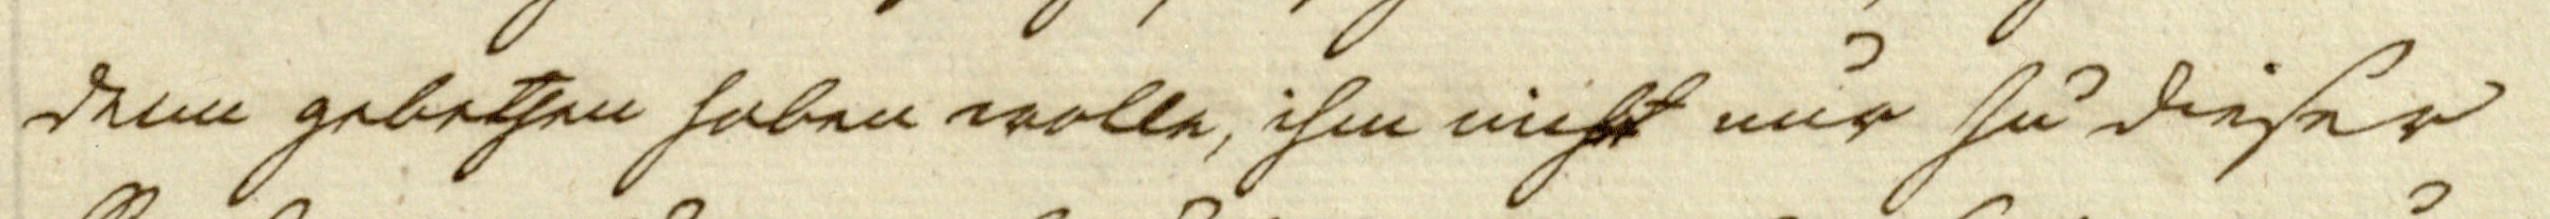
denn gebethen haben wolle, ihm nicht nur zu dieser
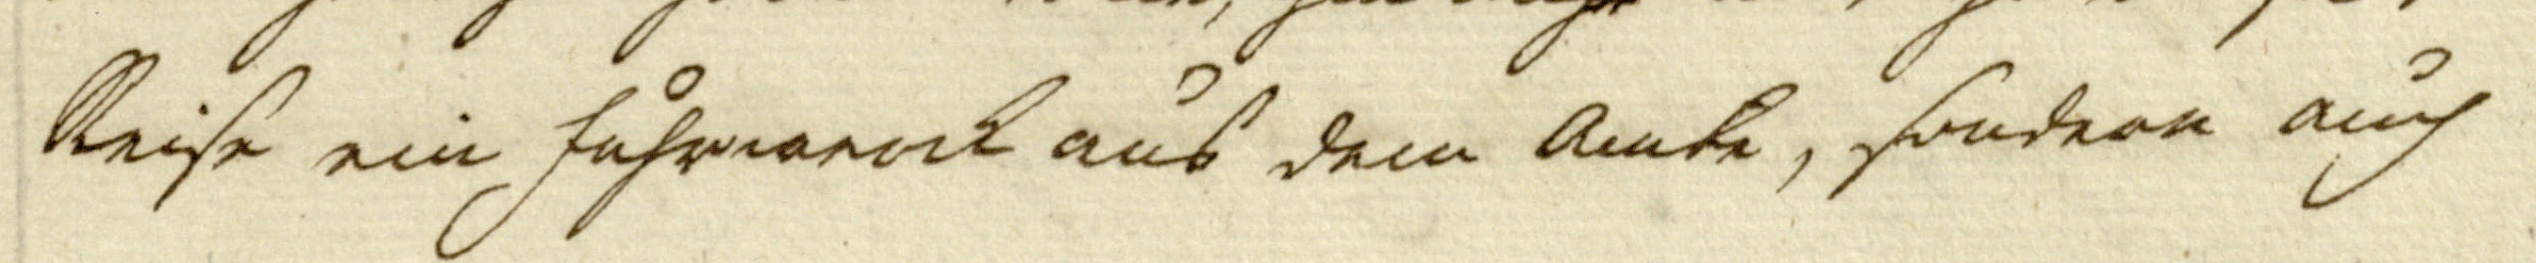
Reise ein Fuhrwerck aus dem Amte, sondern auch
